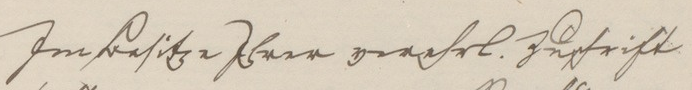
Im Besitze Ihrer verehrl. Zuschrift
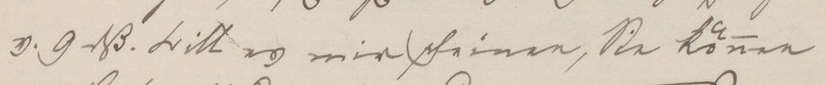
v. 9 dß. will es mir scheinen, Sie können
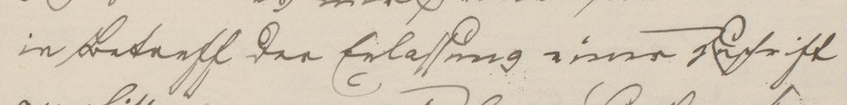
in Betreff der Erlassung einer Zuschrift
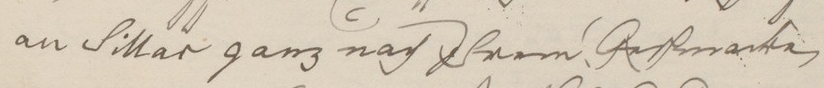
an Sillar ganz nach Ihrem Geschmacke
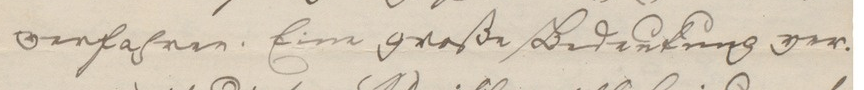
verfahren. Eine große Bedeutung ver-
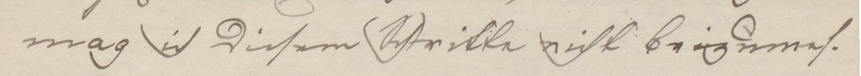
mag ich diesem Schritte nicht beizumes-
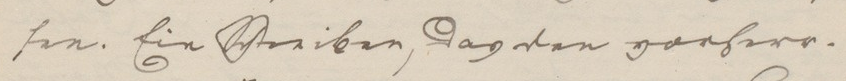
sen. Ein Schreiben, das den vorherr-
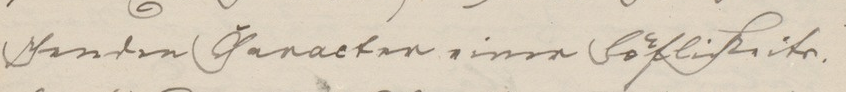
schenden Character einer Höflichkeits-
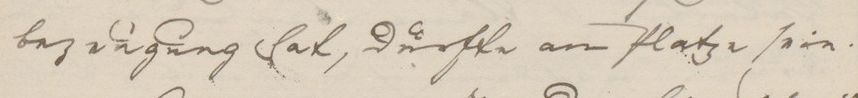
bezeugung hat, dürfte am Platze sein.
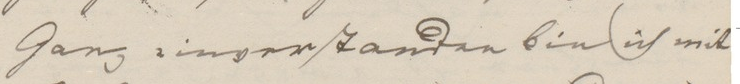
Ganz einverstanden bin ich mit
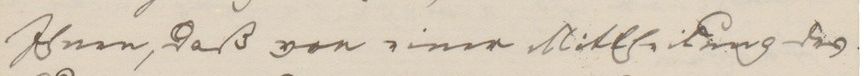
Ihnen, daß von einer Mittheilung des
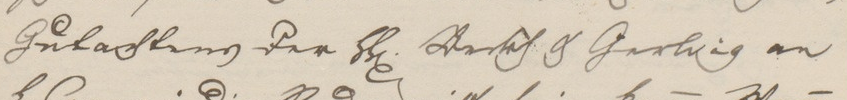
Gutachtens der HH. Beckh & Gerwig an
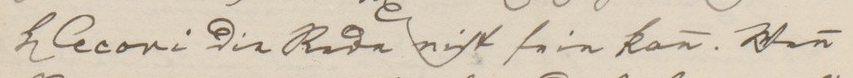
H Cecovi die Rede nicht sein kann. Wenn
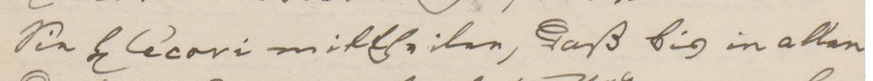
Sie H Cecovi mittheilen, daß bis in allen
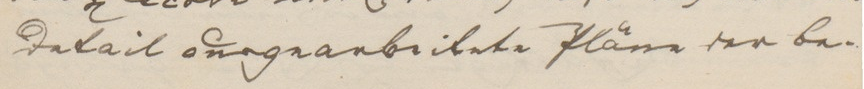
Detail ausgearbeitete Pläne der be-
